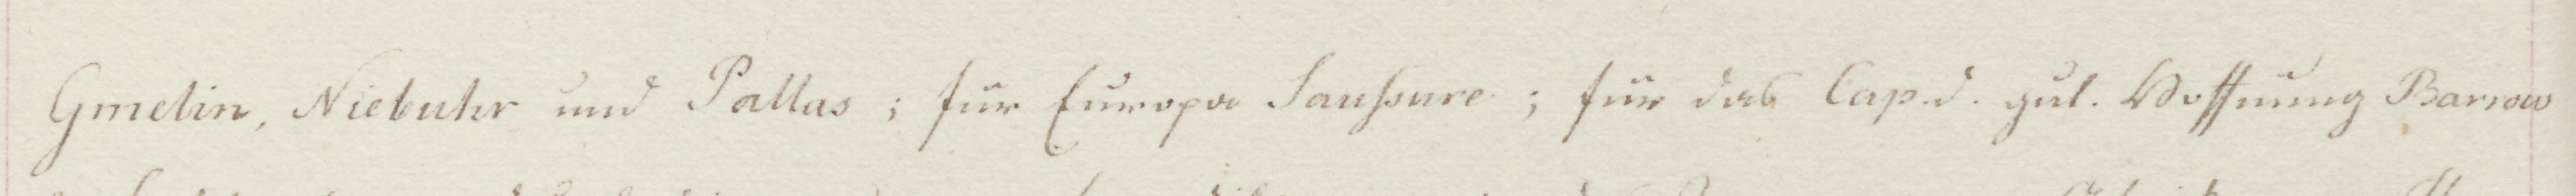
Gmelin, Niebuhr und Pallas; für Europa Saussure; für das Cap d. gut. Hoffnung Barrow
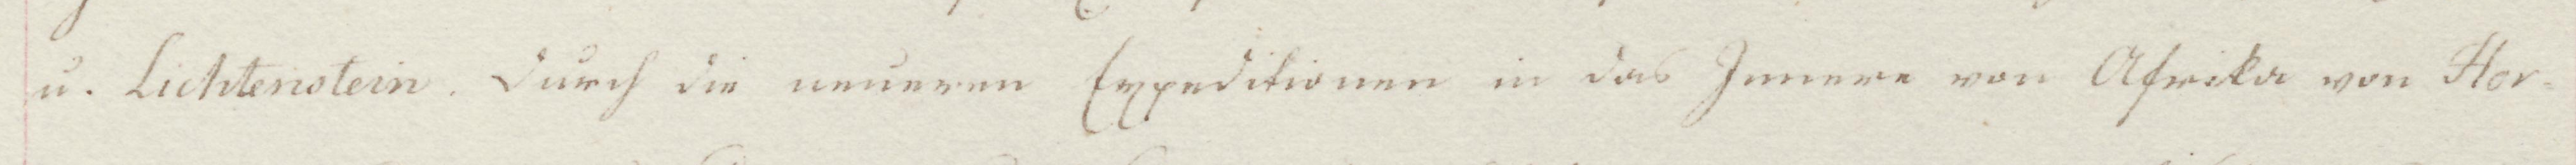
u. Lichtenstein. Durch die neueren Expeditionen in das Innere von Afrika von Hor-
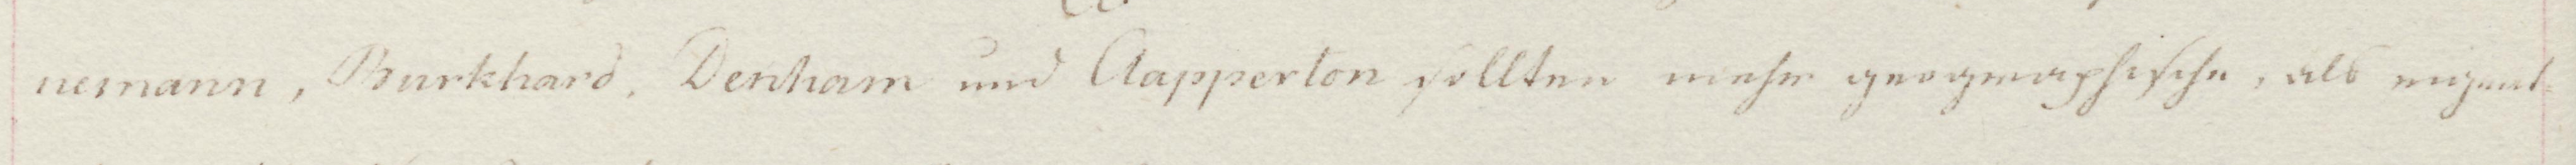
nemann, Burckhard, Denham und Clapperton sollten mehr geographische, als eigent-
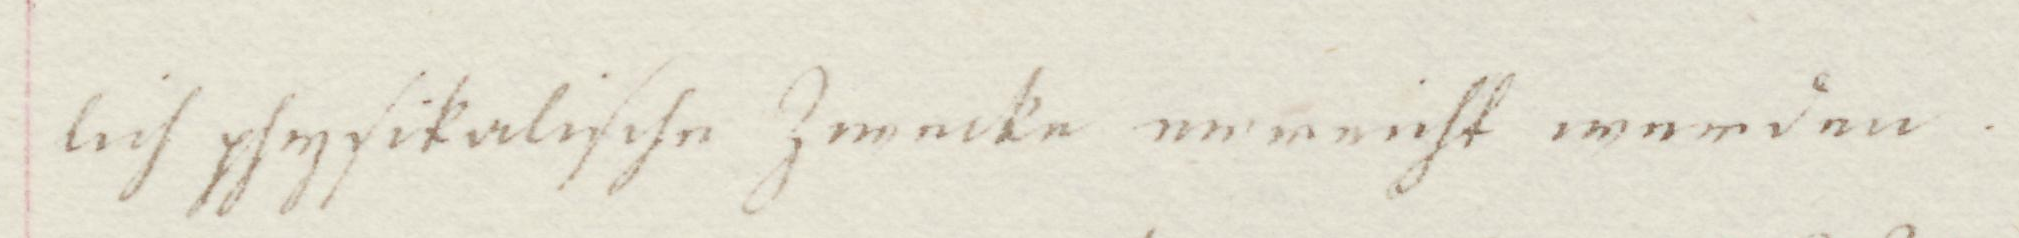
lich physikalische Zwecke erreicht werden.
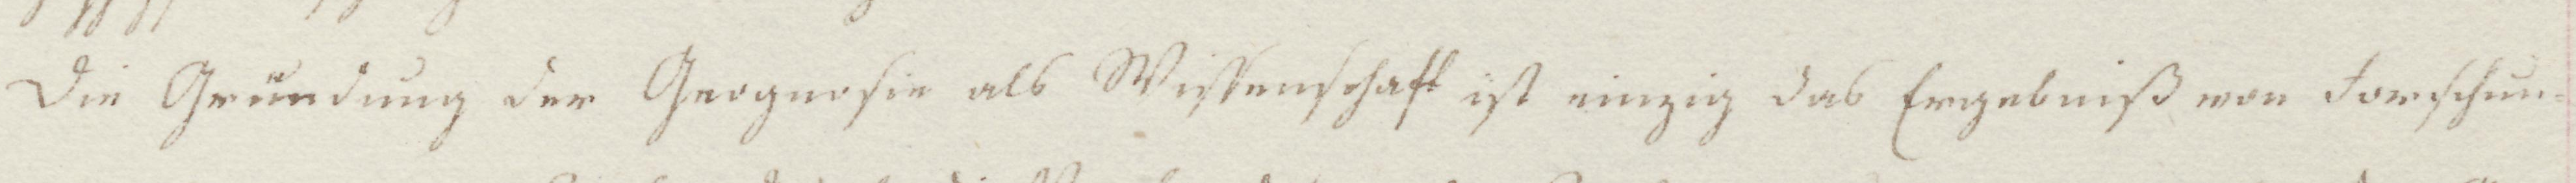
Die Gründung der Geognosie als Wissenschaft ist einzig das Ergebniß von Forschun-
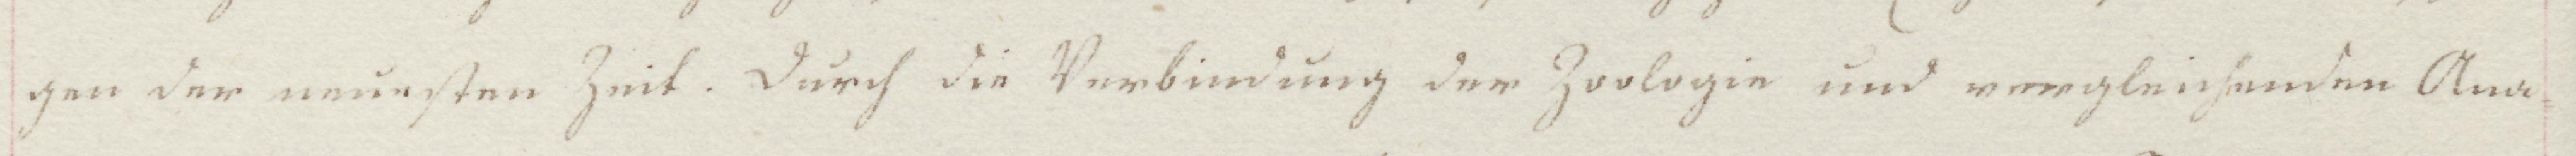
gen der neuesten Zeit. Durch die Verbindung der Zoologie und vergleichenden Ana-
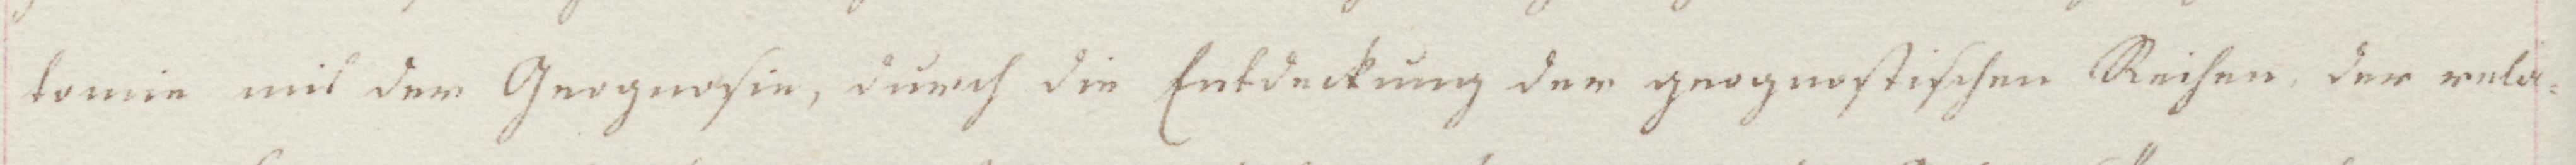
tomie mit der Geognosie, durch die Entdeckung der geognostischen Reisen, der rela-
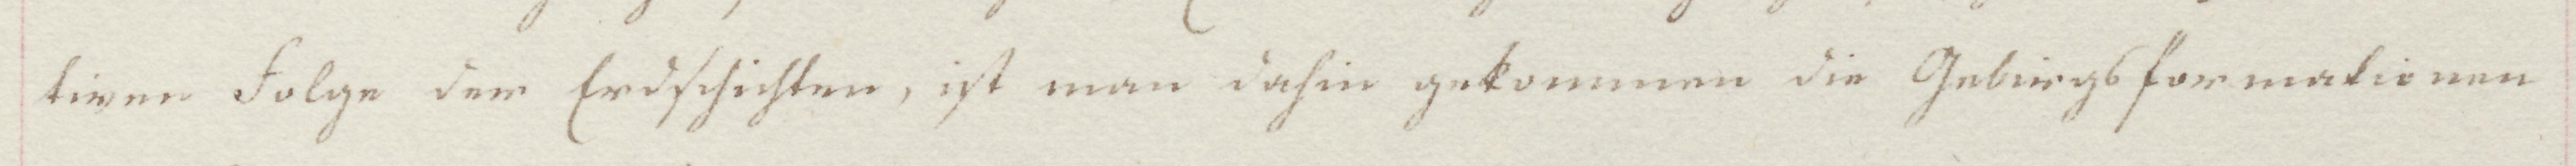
tiven Folge der Erdschichten, ist man dahin gekommen die Gebirgsformationen
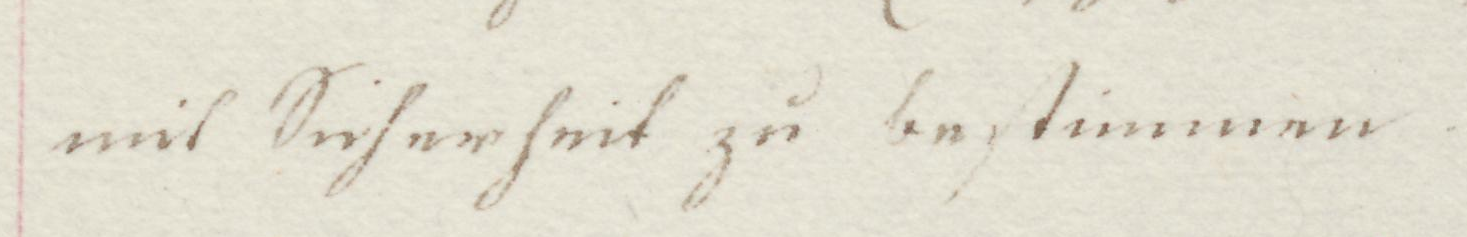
mit Sicherheit zu bestimmen.
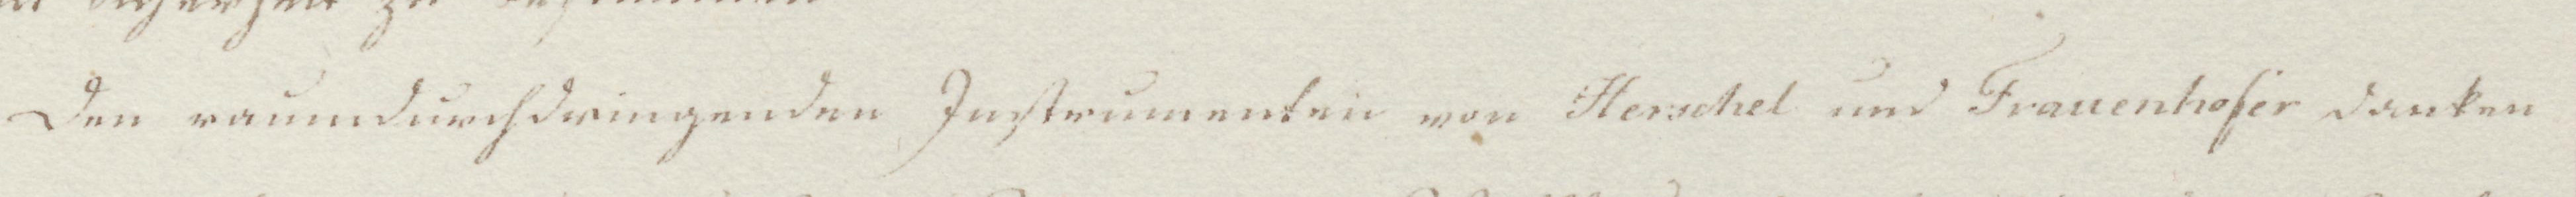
Den raumdurchdringenden Instrumenten von Herschel und Frauenhofer danken
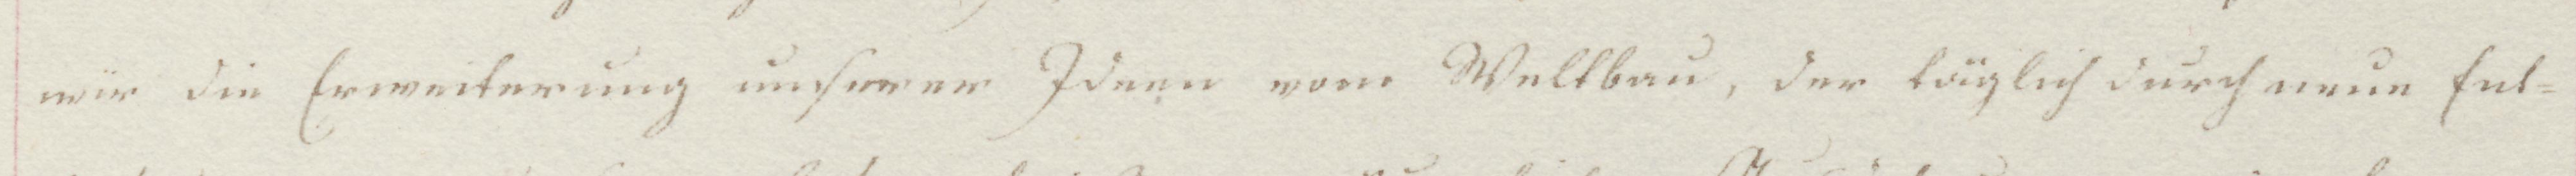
wir die Erweiterung unserer Ideen vom Weltbau, der täglich durch neue Ent-
